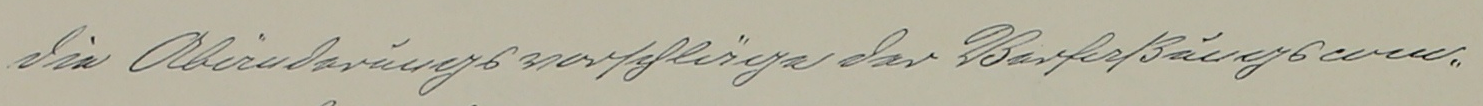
die Abänderungsvorschläge der Verfaßungscom-
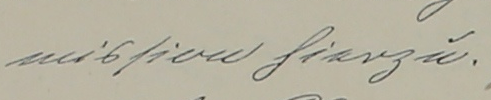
mission hierzu.
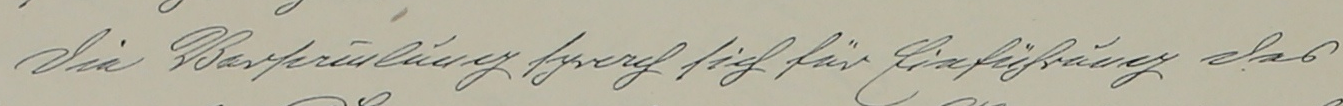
Die Versammlung sprach sich für Einführung des
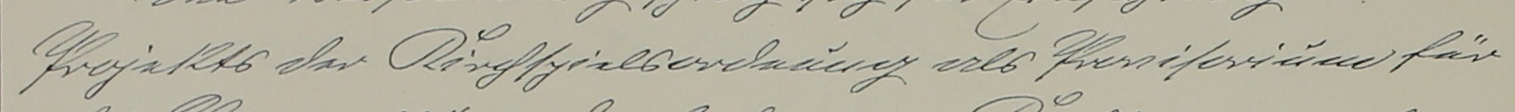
Projekts der Kirchspielsordnung als Provisorium für
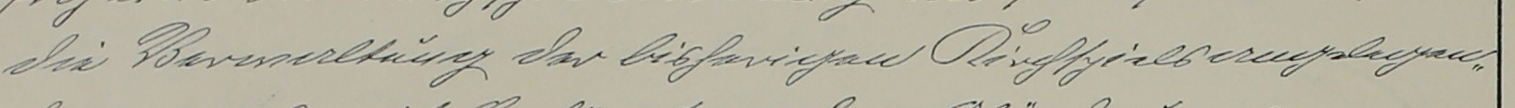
die Verwaltung der bisherigen Kirchspielsangelegen-
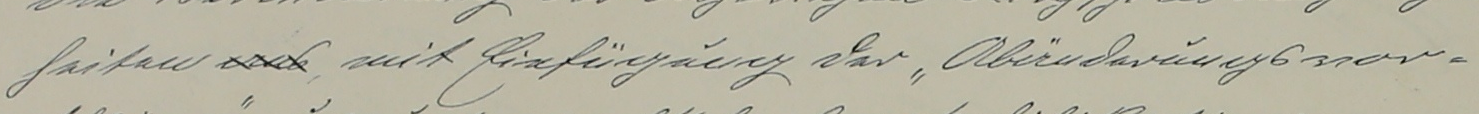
heiten aus, mit Einfügung der „Abänderungsvor-
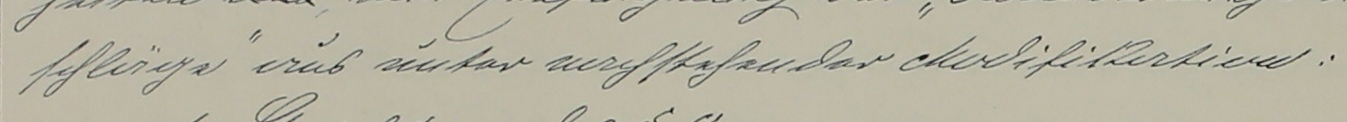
schläge“ aus unter nachstehender Modifikation:
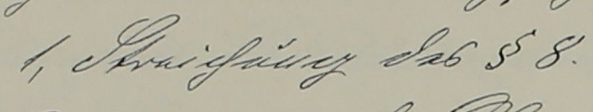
1. Streichung des § 8.
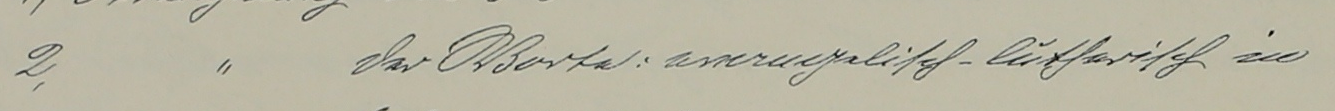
2. " der Worte: evangelisch-lutherisch in
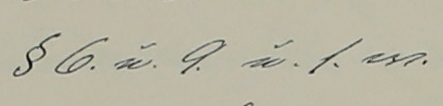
§ 6. u. 9. u.s.w.
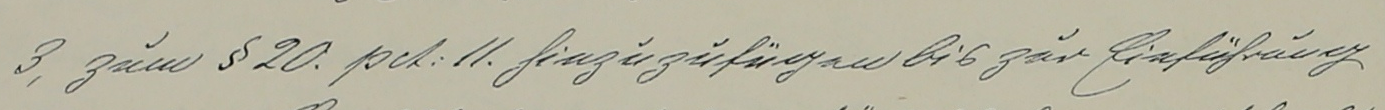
3. zum § 20 pct. 11. hinzuzufügen bis zur Einführung
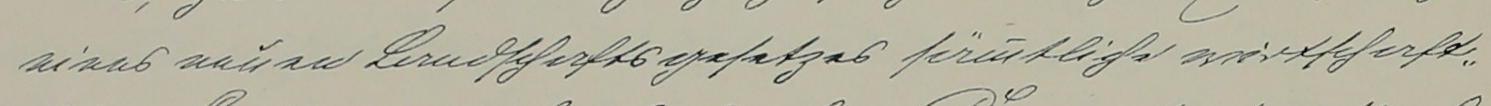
eines neuen Landschaftsgesetzes sämmtliche wirtschaft-
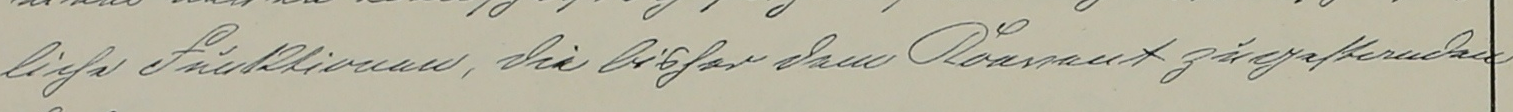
liche Funktionen, die bisher dem Konvent zugestanden
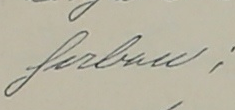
haben;
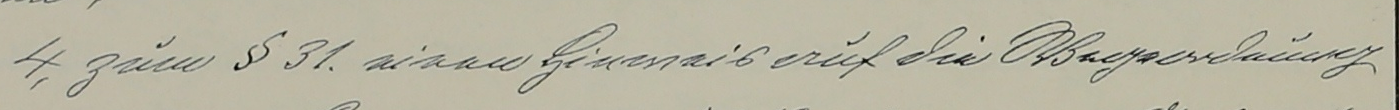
4. zum § 31. einen Hinweis auf die Wegeordnung
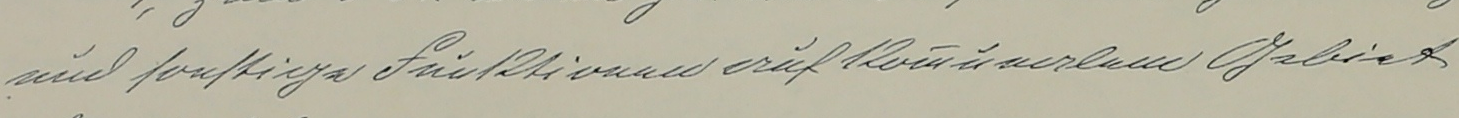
und sonstige Funktionen auf kommunalem Gebiet
